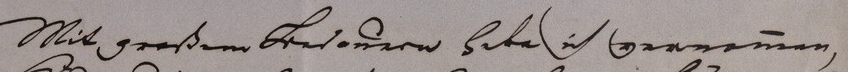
Mit großem Bedauern habe ich vernommen,
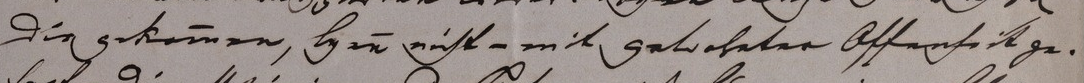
dir gekommen, wenn nicht – mit gewohnter Offenheit ge-
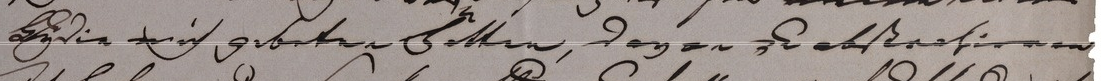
Lydia mich gebeten hätten, davon zu abstrahieren.
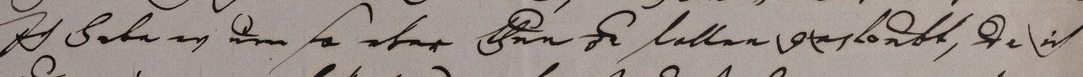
Ich habe es um so eher thun zu sollen geglaubt, da ich
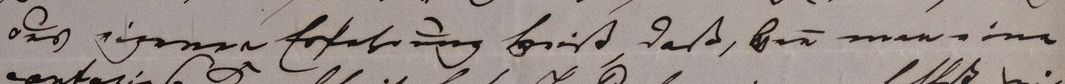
aus eigener Erfahrung weiß, daß, wenn man eine
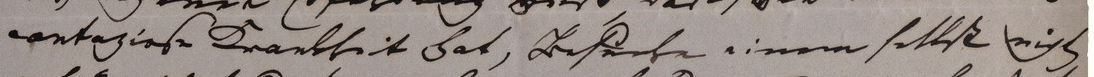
contagiose Krankheit hat, Besuche einem selbst nicht
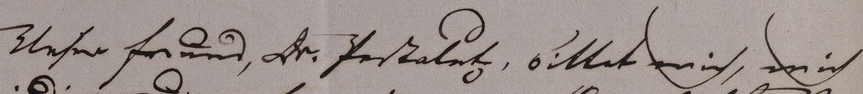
Unser Freund, Dr. Pestalutz, bittet mich, mich
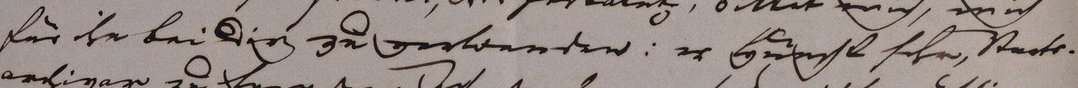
für ihn bei dir zu verwenden: er wünscht sehr, Staats-
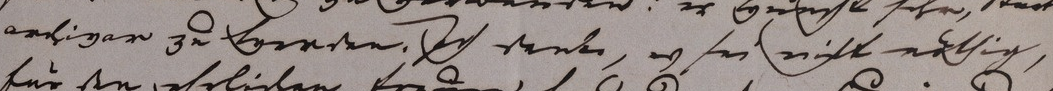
archivar zu werden. Ich denke, es sei nicht nöthig,
